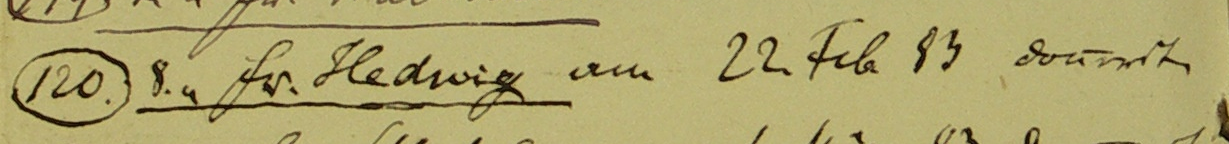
120. 8) Fr. Hedwig am 22. Februar 83 Donnerstag
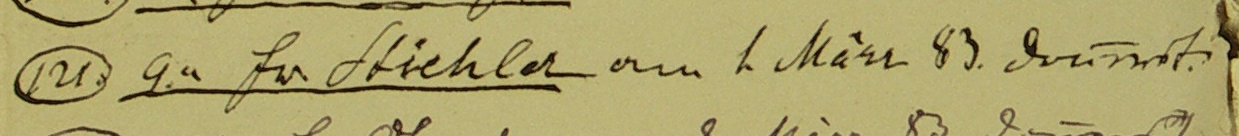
121. 9) Fr. Stieler am 1. März 83 Donnerstag
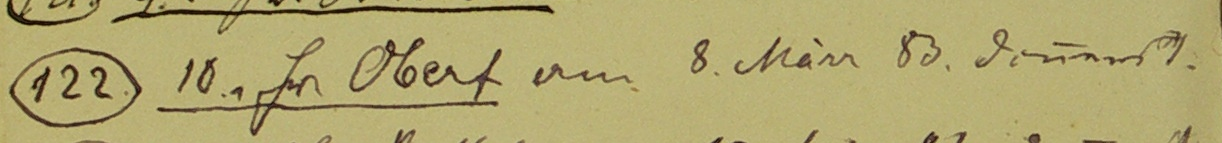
122. 10) Fr. Obert am 8. März 83 Donnerstag
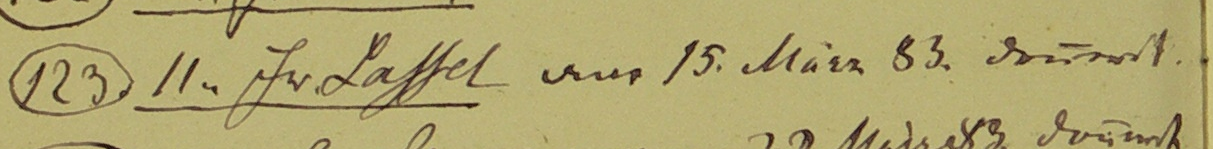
123. 11) Fr. Lassel am 15. März 83 Donnerstag
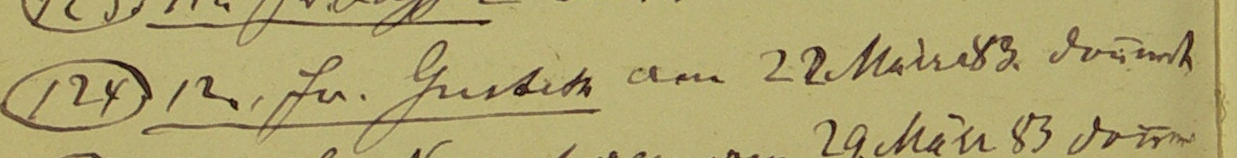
124. 12) Fr. Gusbeth am 22. März 83 Donnerstag
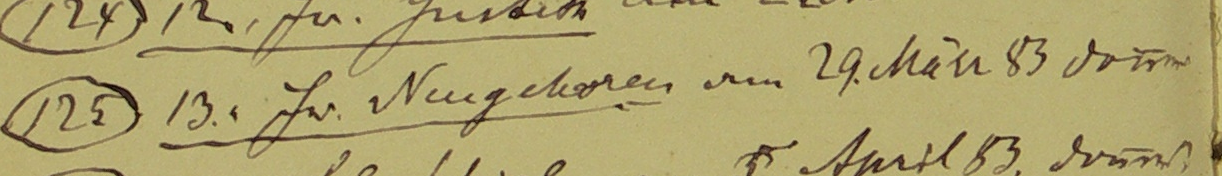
125. 13) Fr.Neugeboren am 29. März 83 Donnerstag
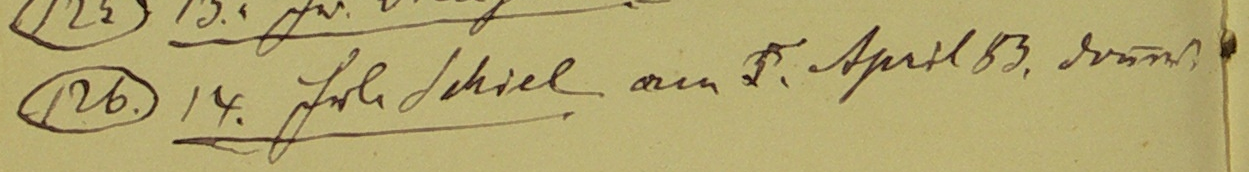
126. 14) Frl. Schiel am 5.April 83 Donnerstag
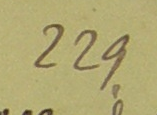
229
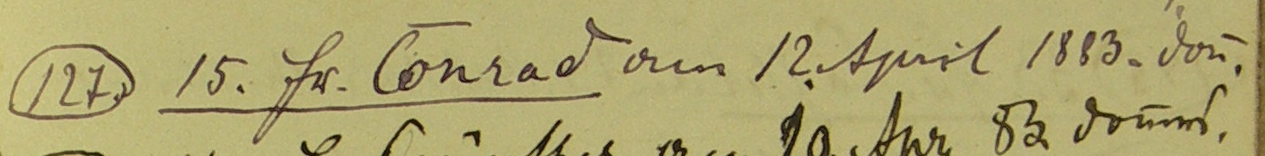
127. 15) Bei Fr. Conrad am 12. April 83 Donnerstag
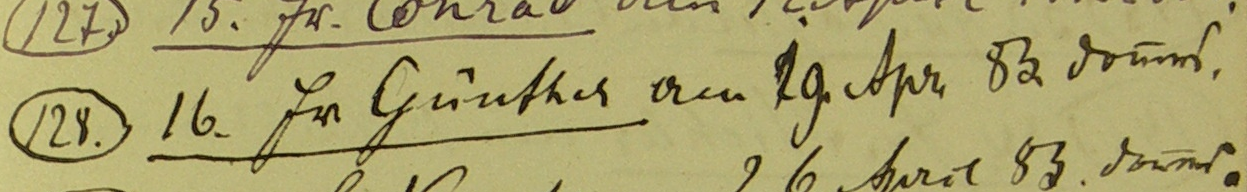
128. 16) Fr. Günther am 19. April 83 Donnerstag
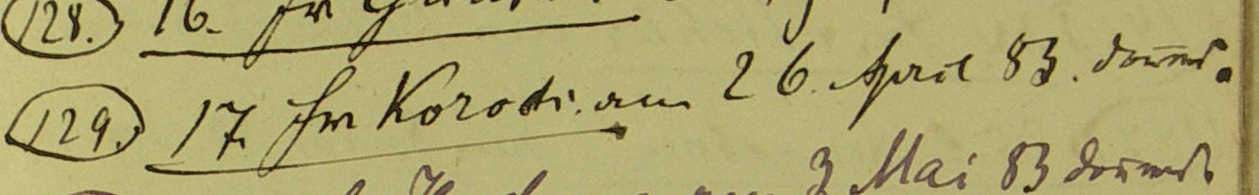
129. 17) Fr. Korodi am 26. April 83 Donnerstag
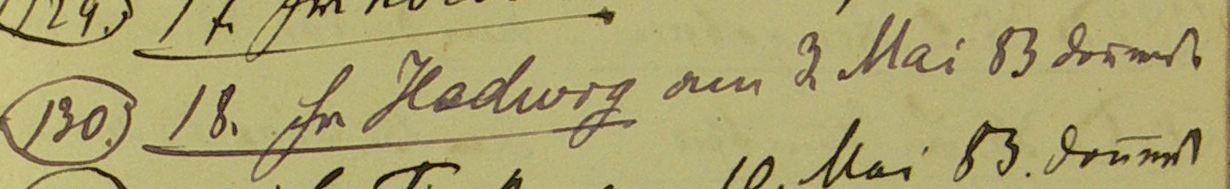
130. 18) Fr. Hedwig am 3. Mai 83 Donnerstag
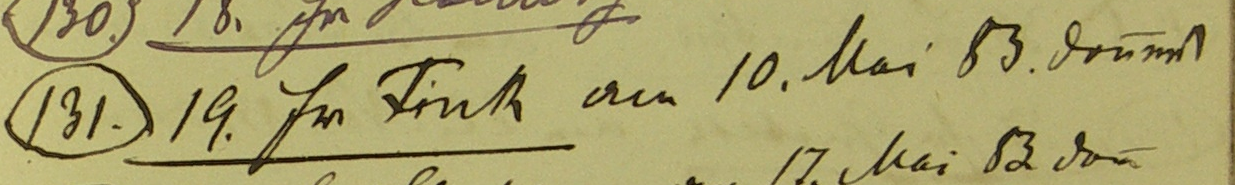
131. 19) Fr. Fink am 10. Mai 83 Donnerstag
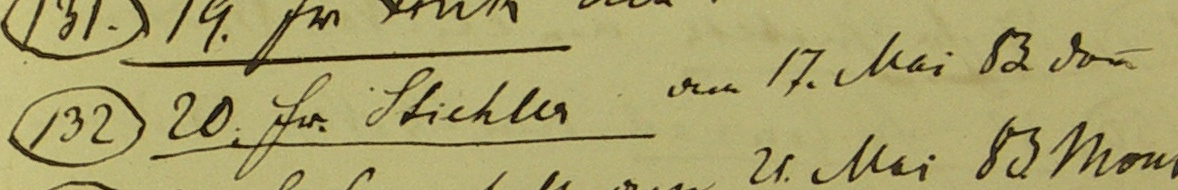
132. 20) Fr. Stiehler am 17. Mai 83 Donnerstag
